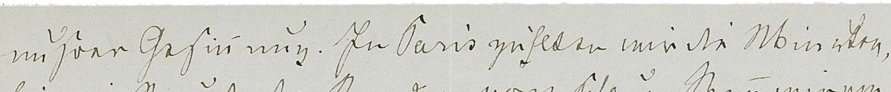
unsrer Gesinnung. In Paris zählten wir die Minuten,
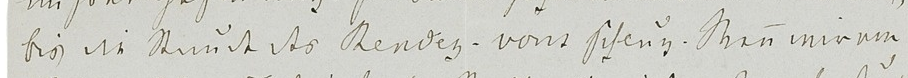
bis die Stunde des Rendez-vous schlug. Wenn wir am
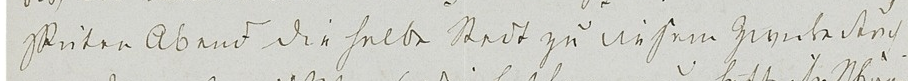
späten Abend die halbe Stadt zu diesem Zwecke durch-
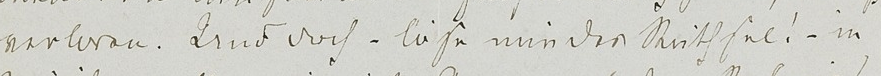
verloren. Und doch – löse mir das Räthsel! – in
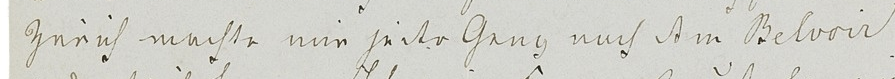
Zürich machte mir jeder Gang nach dem Belvoir
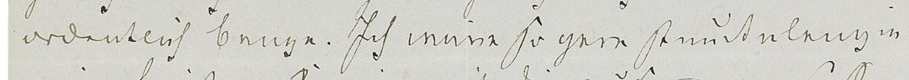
ordentlich bange. Ich wäre so gern stundenlang in
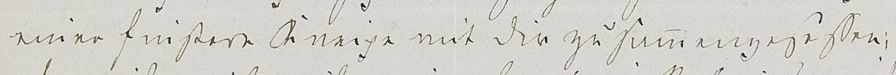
einer finstern Kneipe mit dir zusammengesessen;
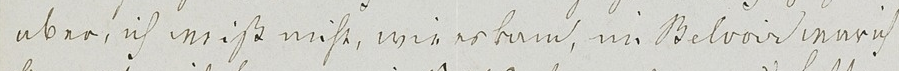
aber, ich weiß nicht, wie es kam, im Belvoir war ich
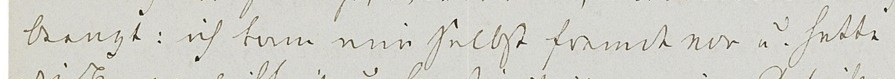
beengt: ich kam mir selbst fremd vor u. hatte
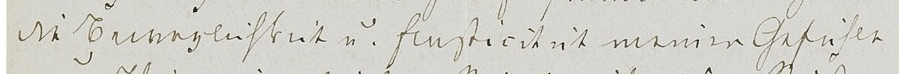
die Beweglichkeit u. Elasticität meiner Gefühle
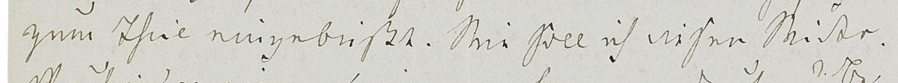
zum Theil eingebüßt. Wie soll ich diesen Wider-
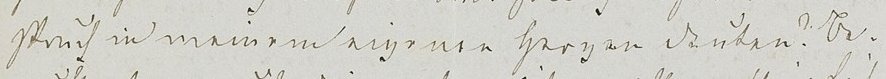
spruch in meinem eigenen Herzen deuten? Be-
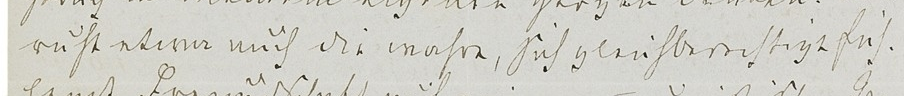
ruht etwa auch die wahre, sich gleichberechtigt füh-
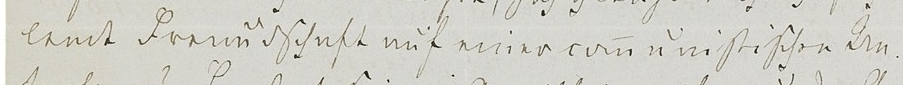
lende Freundschaft auf einer communistischen Un-
